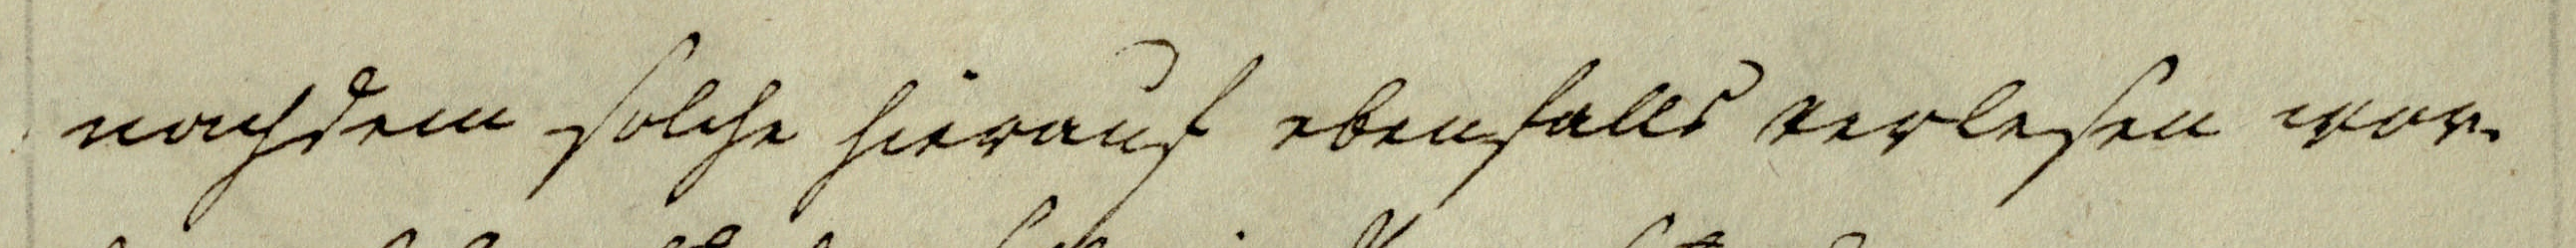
nachdem solche hierauf ebenfalls verlesen wor¬
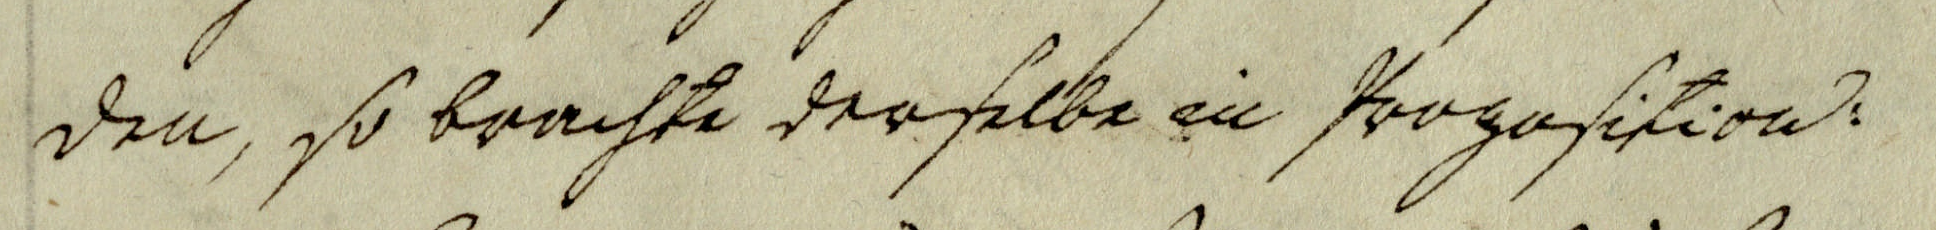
den, so brachte derselbe in Proposition:
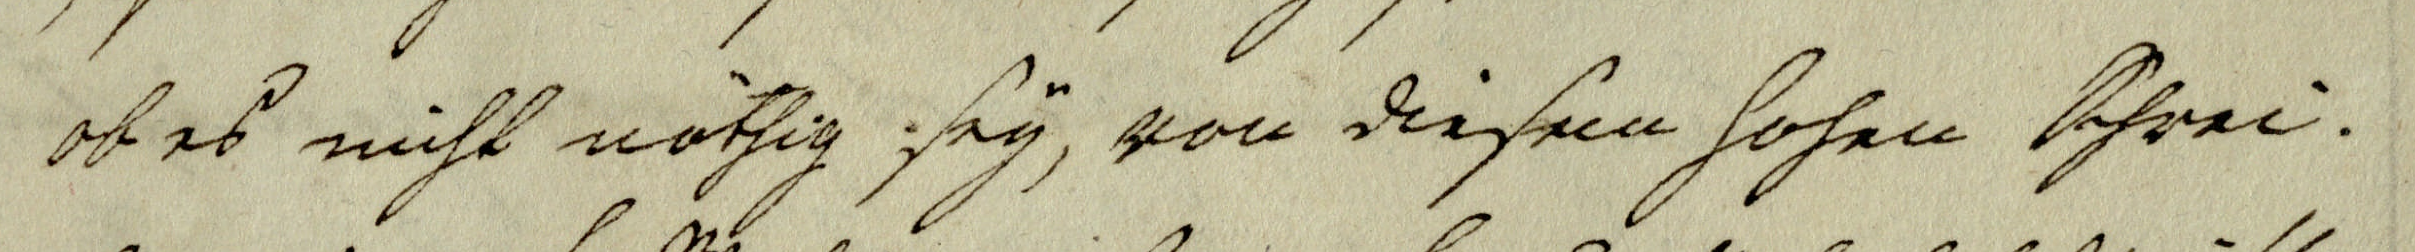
ob es nicht nöthig seÿ, von diesem hohen Schrei¬
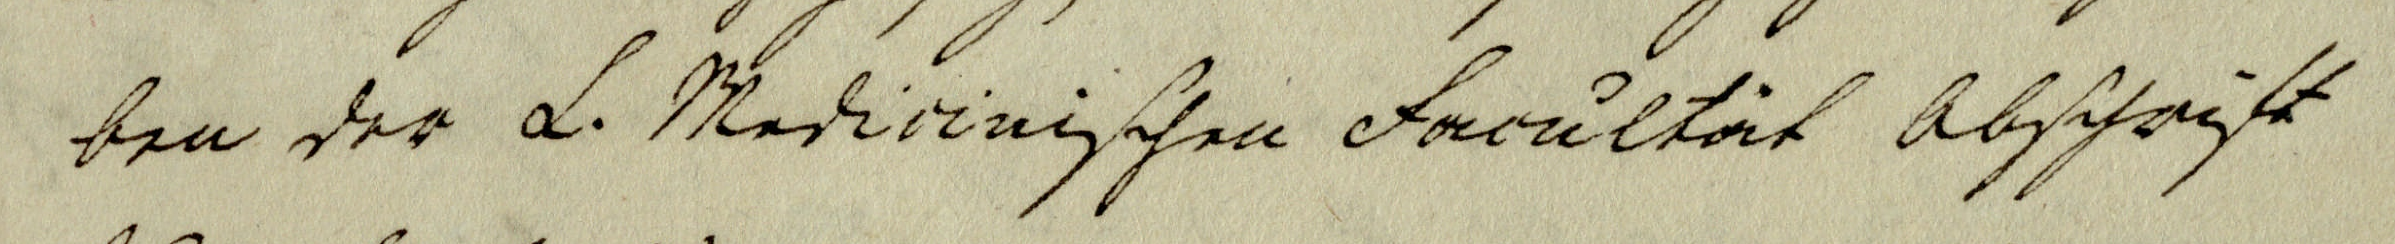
ben der L. Medicinischen Facultät Abschrift
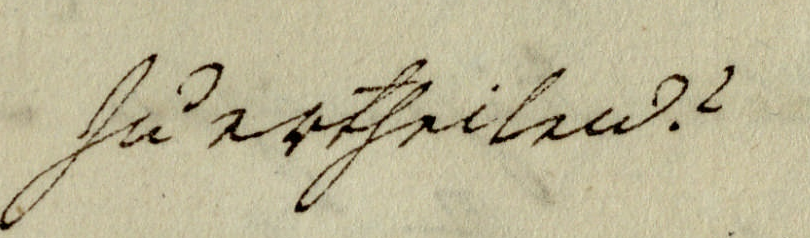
zu ertheilen?
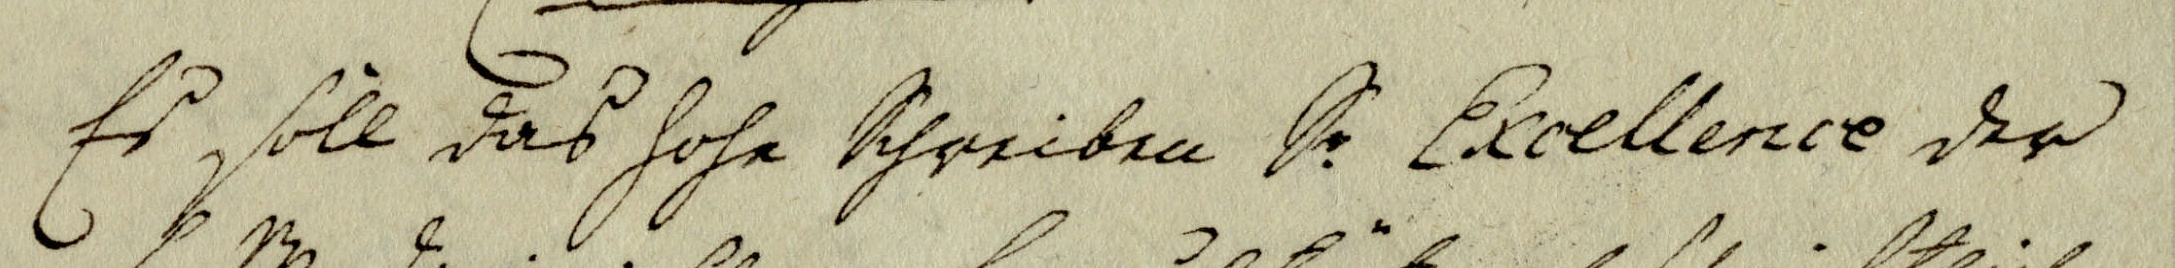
Es soll das hohe Schreiben Sr Excellence der
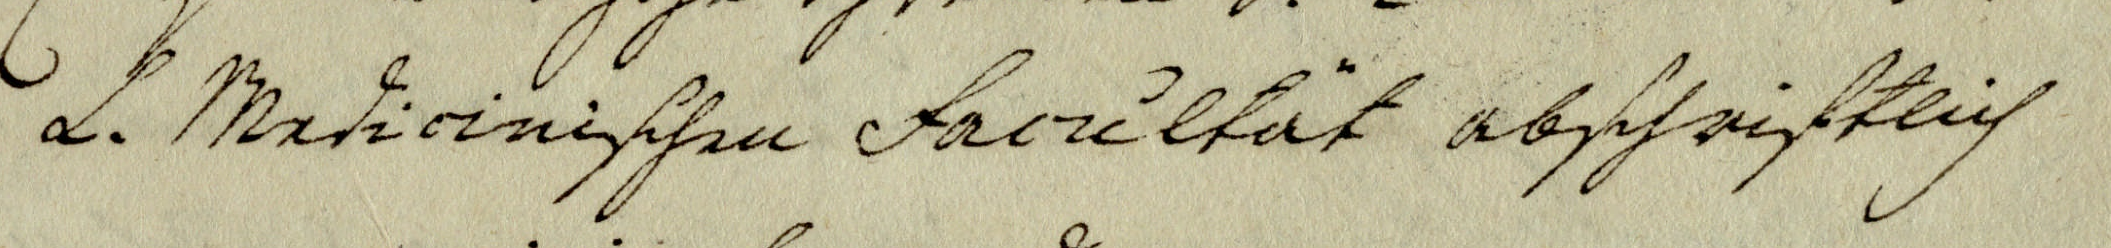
L. Medicinischen Facultät abschriftlich
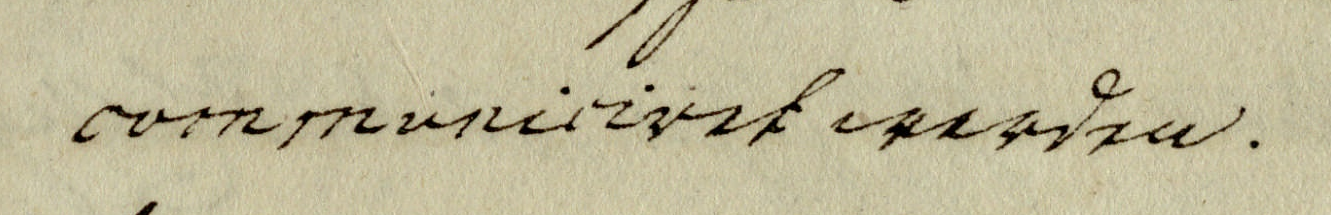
communiciret werden.
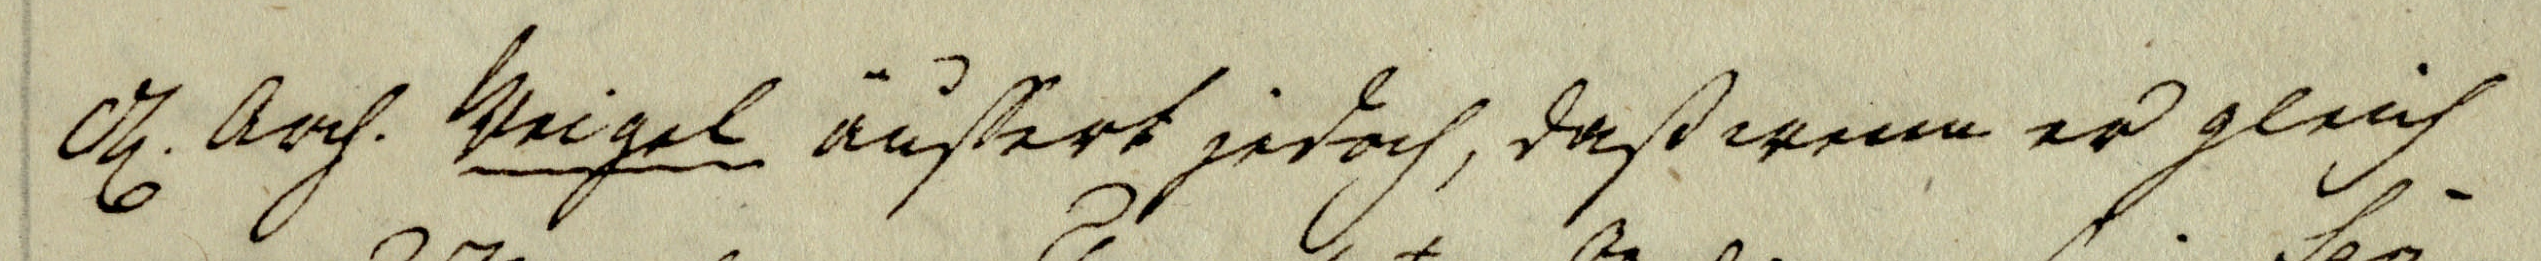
dh. Arch. Weigel äussert jedoch, daß wenn er gleich
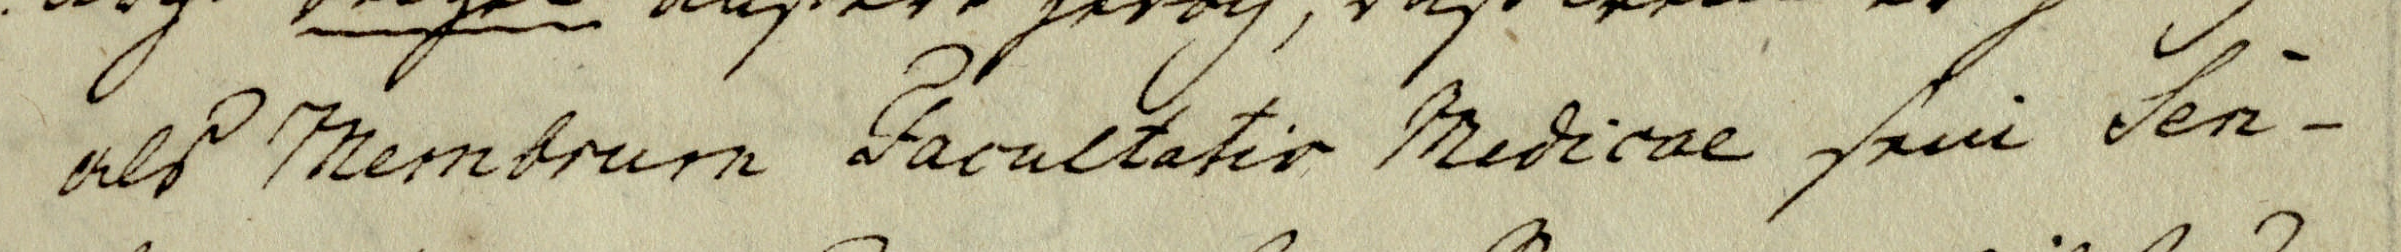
als Membrum Facultatis Medicae sein Sen¬
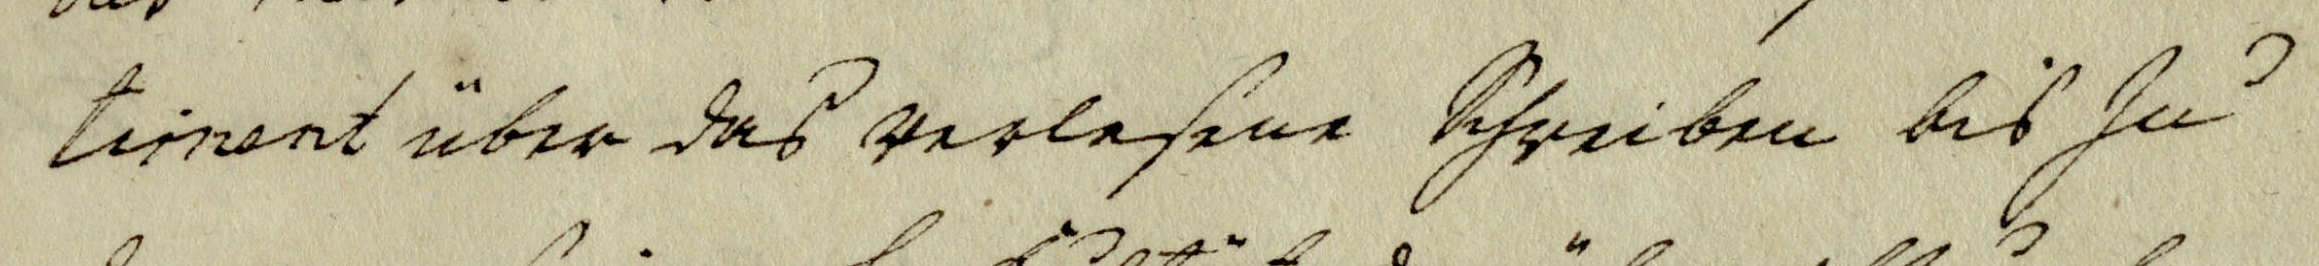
timent über das verlesene Schreiben bis zu
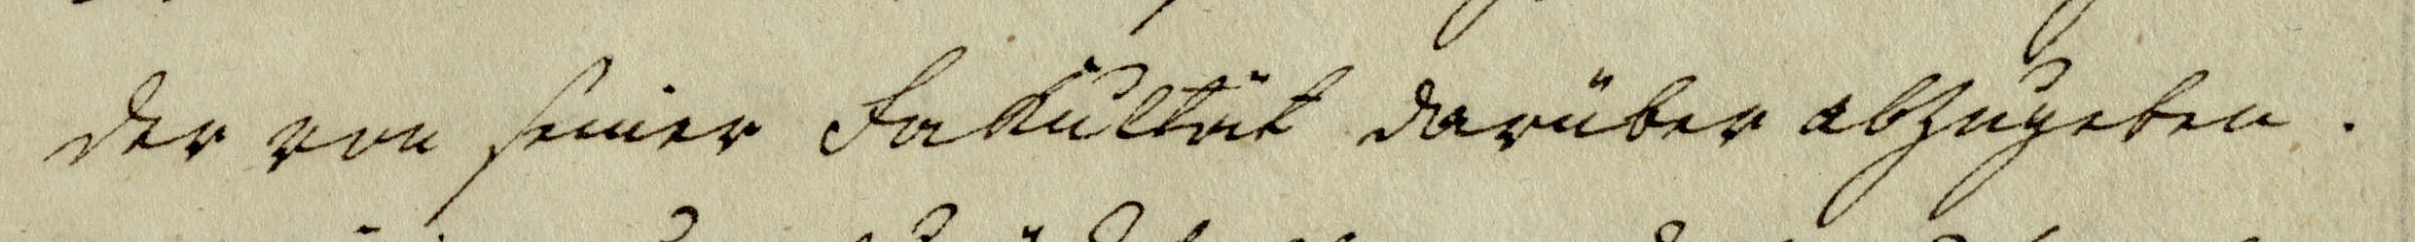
der von seiner Fakultät darüber abzugeben¬
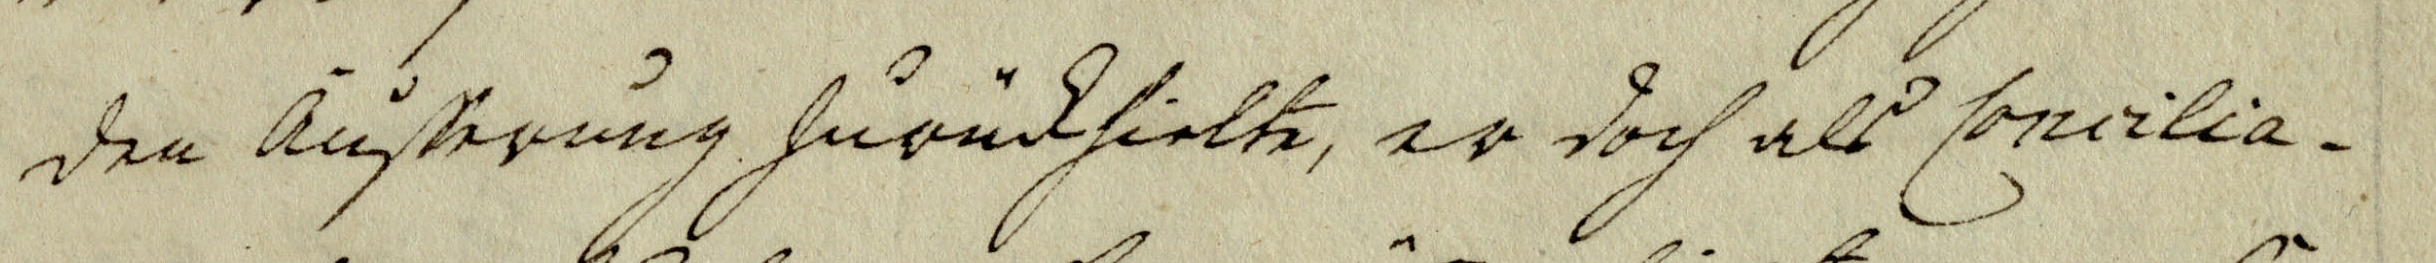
den Äusserung zurückhielte, er doch als Concilia
